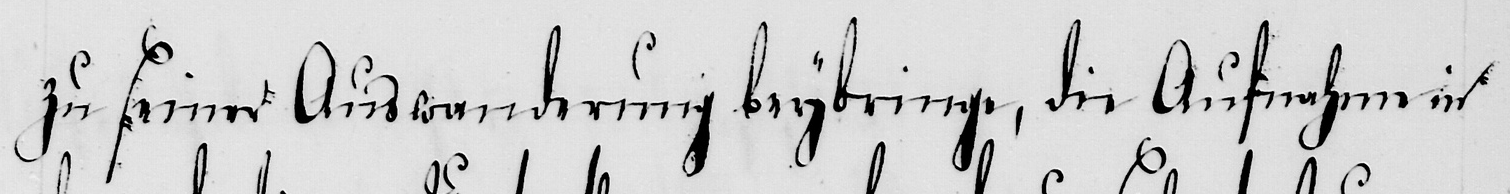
zu seiner Auswanderung beybringe, die Aufnahme in
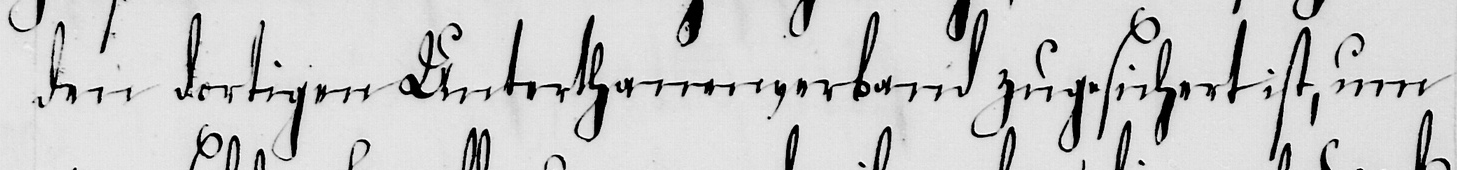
den dortigen Unterthanenverband zugesichert ist, um
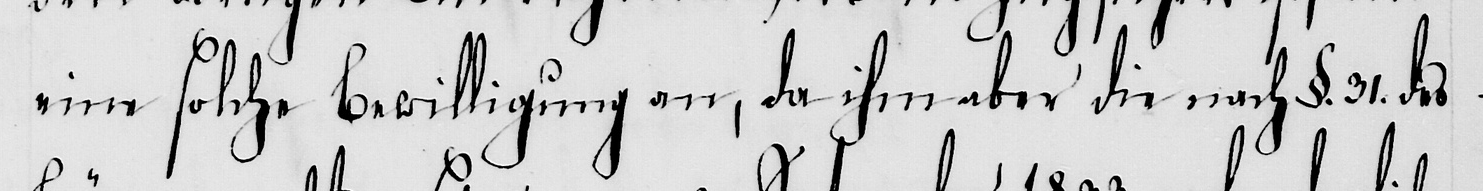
eine solche Bewilligung an, da ihm aber die nach §. 31.
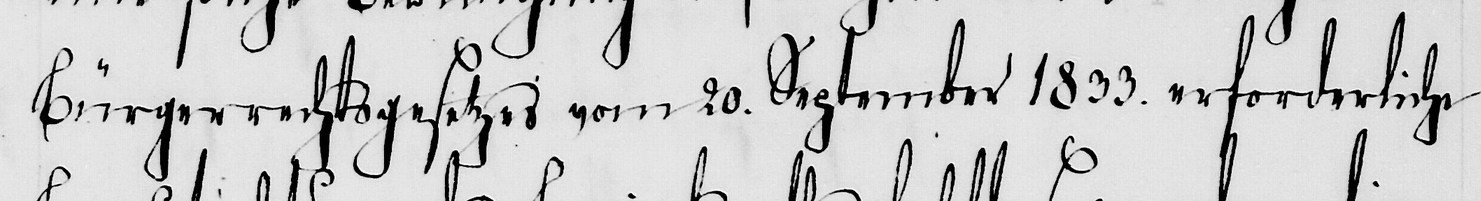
Bürgerrechtsgesetzes vom 20. September 1833. erforderliche
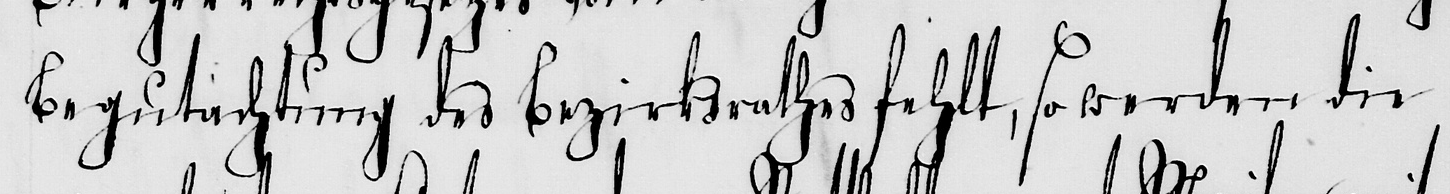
Begutachtung des Bezirksrathes fehlt, so werden die
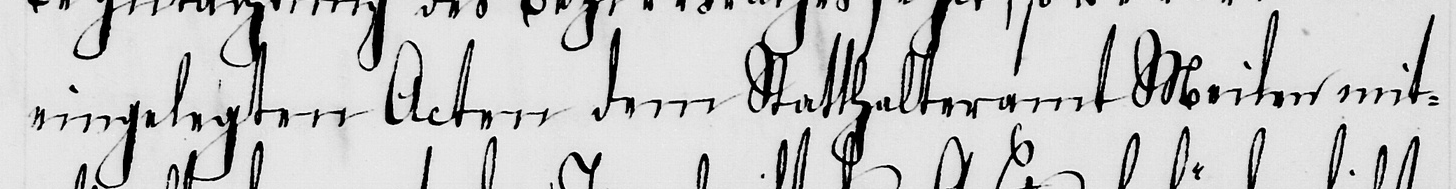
eingelegten Acten dem Statthalteramt Meilen mitg¬
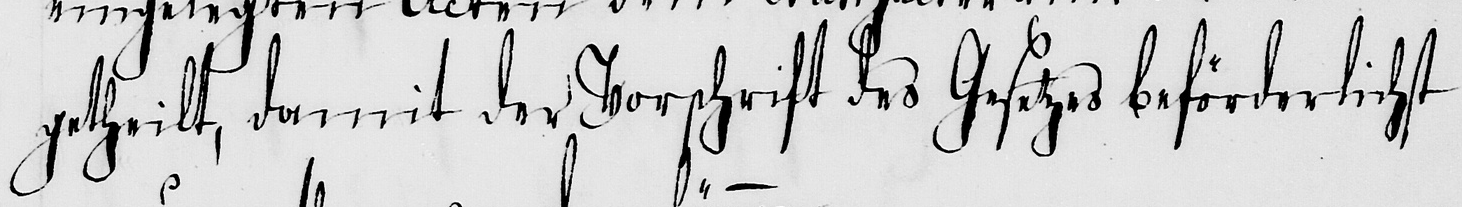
etheilt, damit der Vorschrift des Gesetzes beförderlic¬
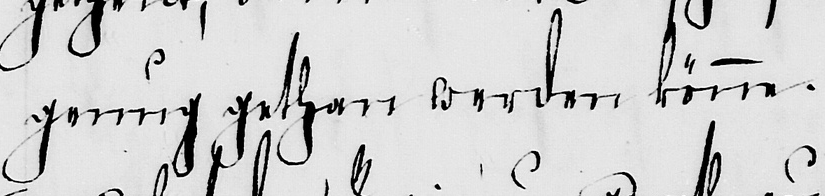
genug gethan werden könne.
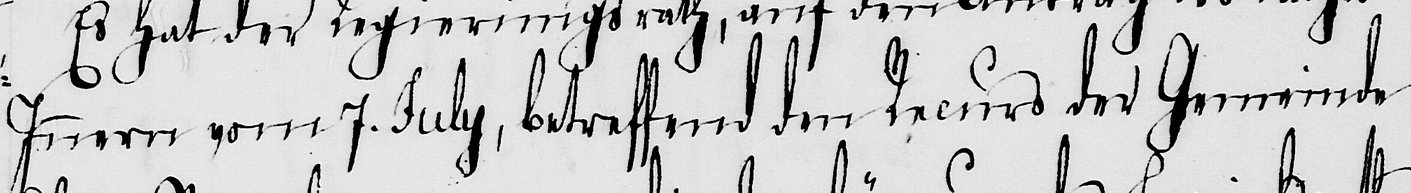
Innern vom 7. July, betreffend den Recurs der Gemeinde
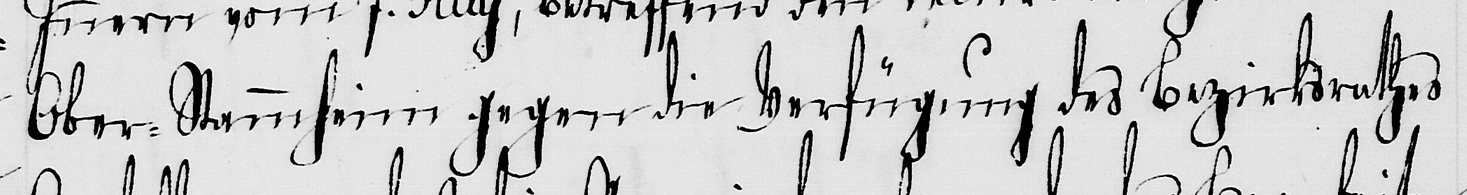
Ober-Stammheim gegen die Verfügung des Bezirksrathes
